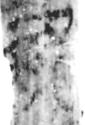龍
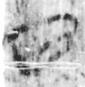日
